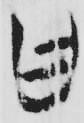曰
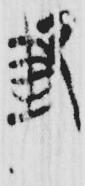○（犯）
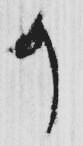人
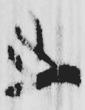之
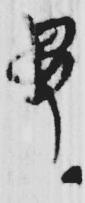○（務）
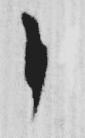十
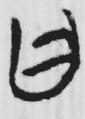曰
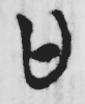口
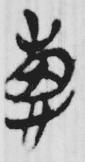惠
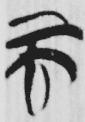而
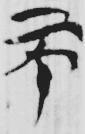不
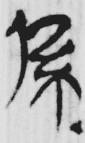○（由）
